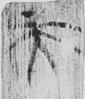天
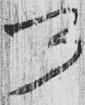乃
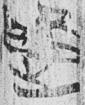○（降）
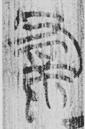○（異）
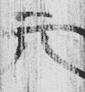亓
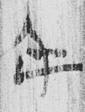身
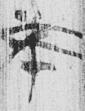不
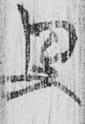○（沒）
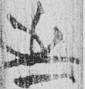至
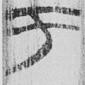于
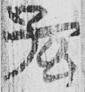孫子
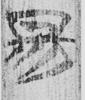昜（陽）
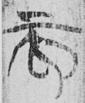而
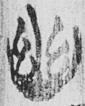幽
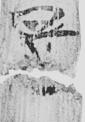是
